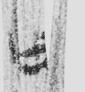曰
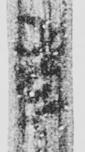考（巧）
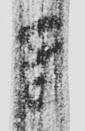言
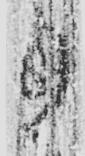色
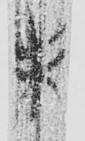未
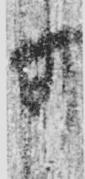可
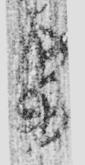胃（謂）
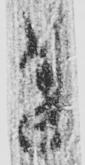○（仁）
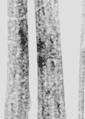也
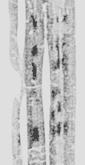者
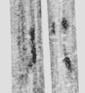亓（其）
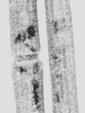言
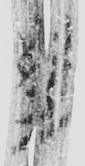乘
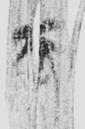而
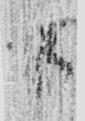不
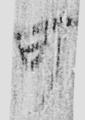可
